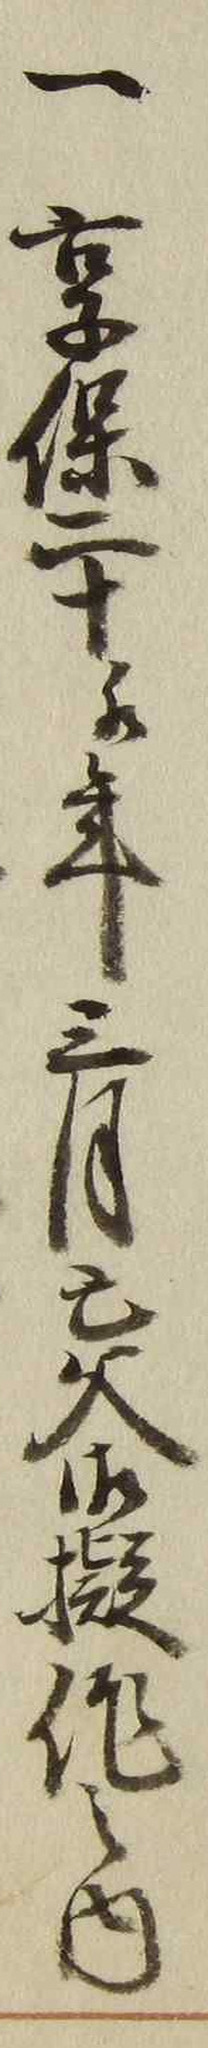一享保二十卯年三月亡父御擬作之内
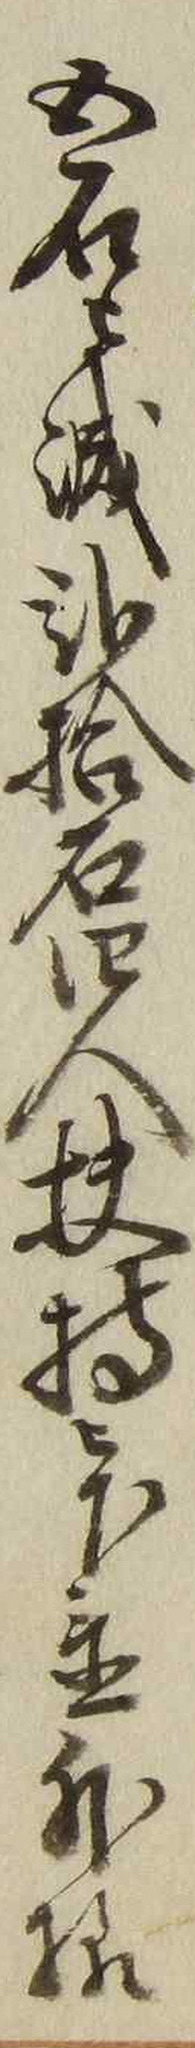五石被減弐拾石四人扶持被下置外様
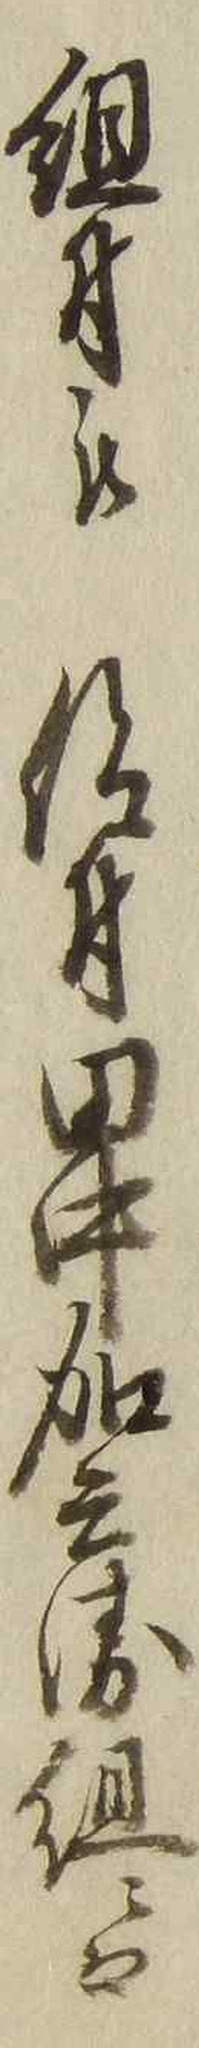組付被仰付田中加兵衛組ニ而

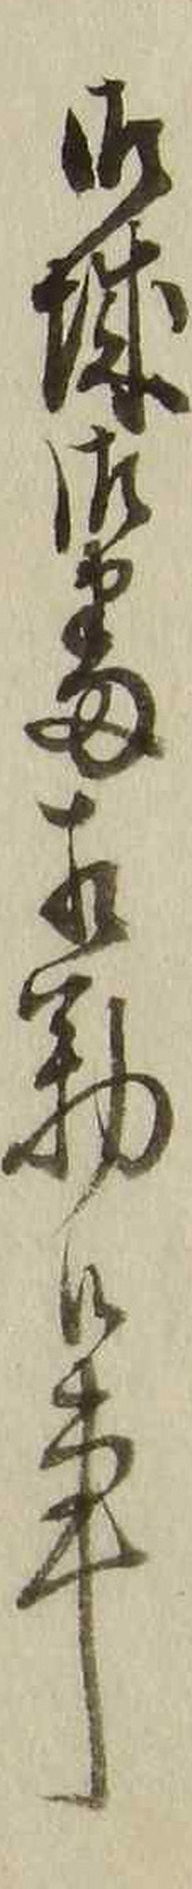御城御番相勤候事
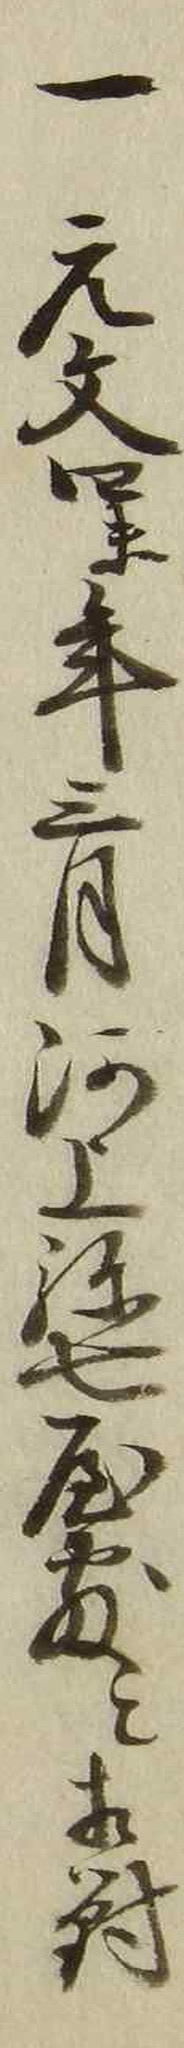一元文四未年三月河上弥七屋敷と相対
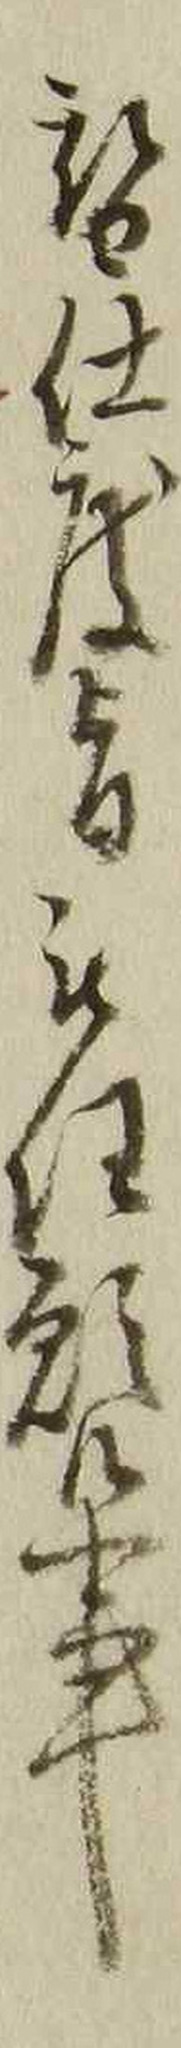替仕度旨被任願候事
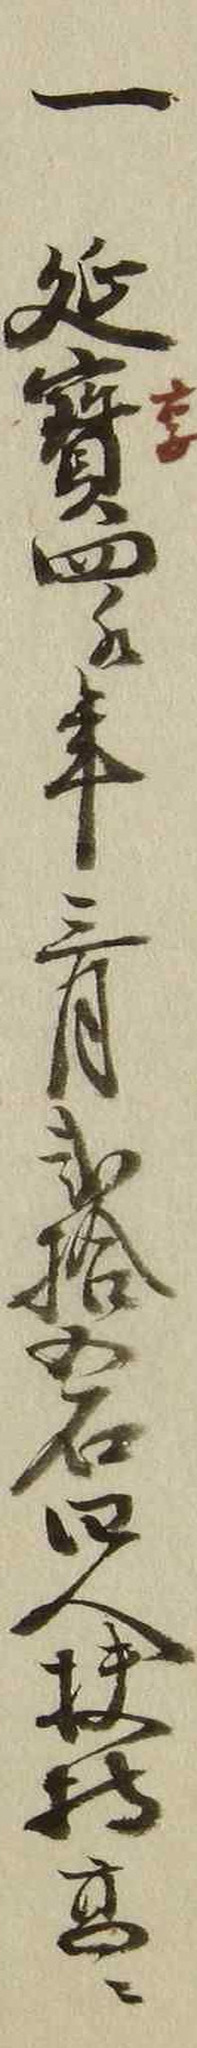一延享四卯年三月弐拾五石四人扶持高ニ
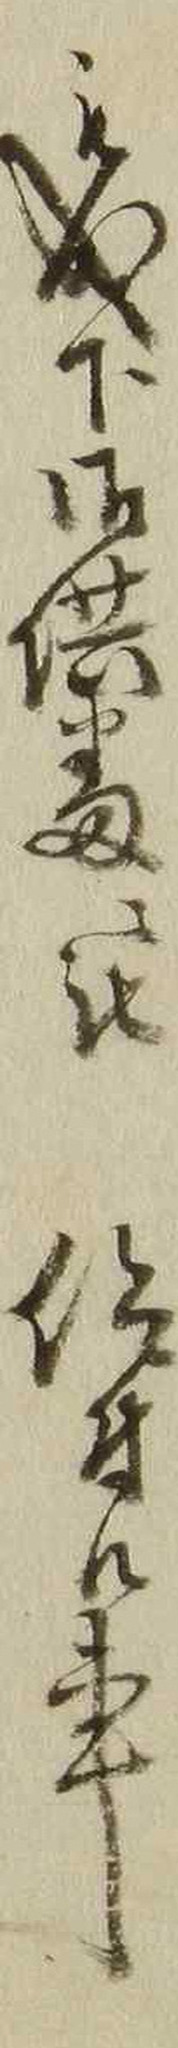被成下御供番ニ被仰付候事
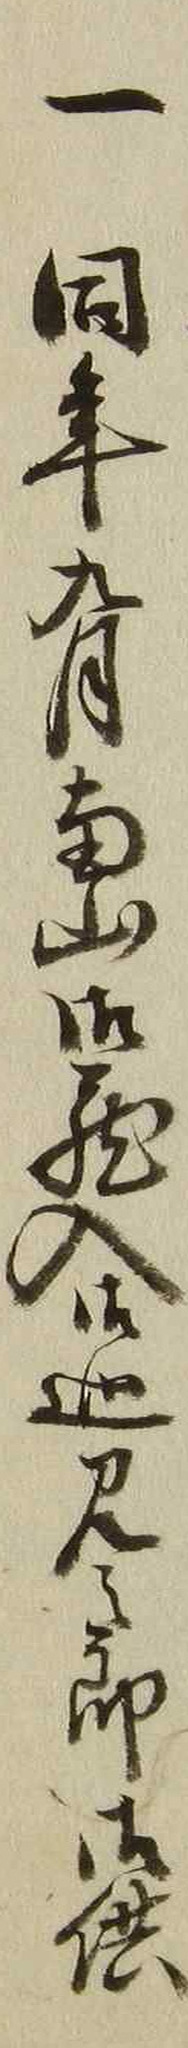一同年九月南山御蔵入御巡見之節御供
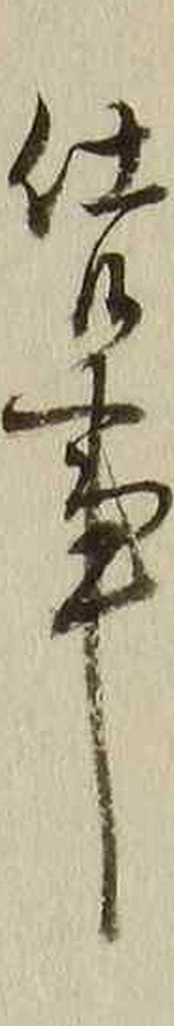仕候事
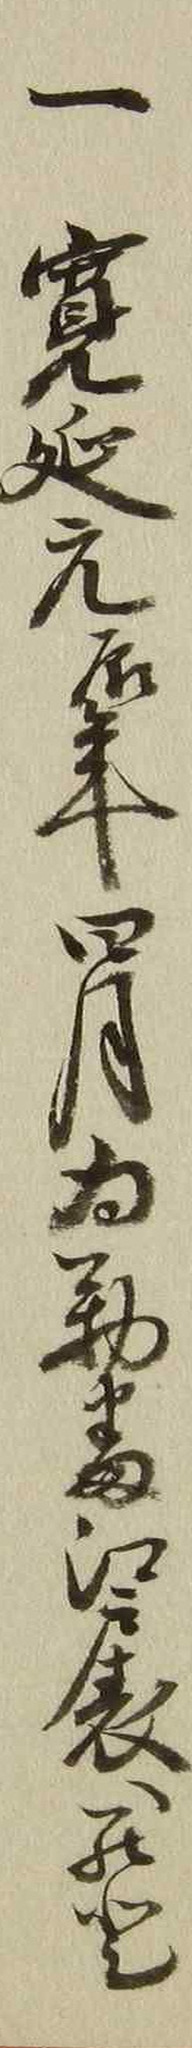一寛延元辰年四月為勤番江戸表へ罷登
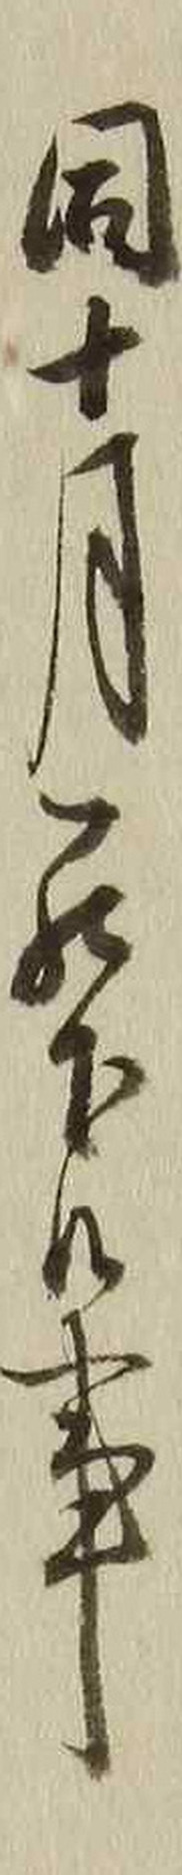同十月罷下候事
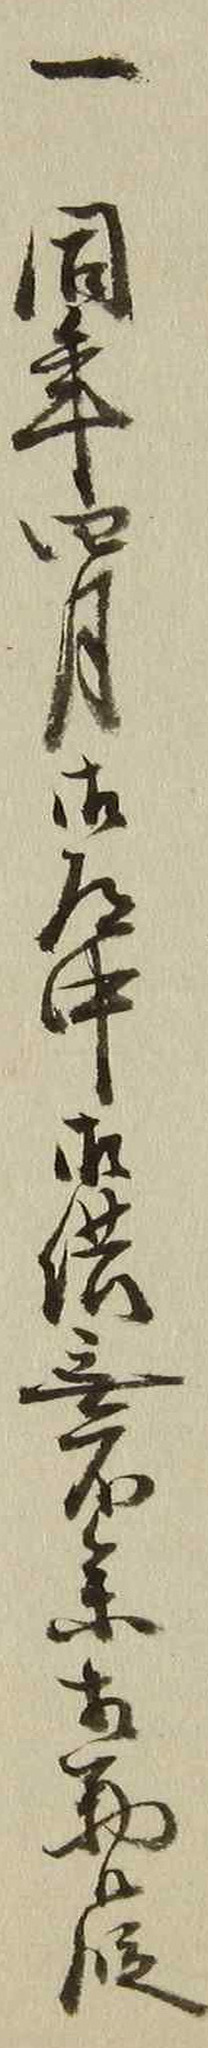一同年四月御道中御供無不参相勤候段
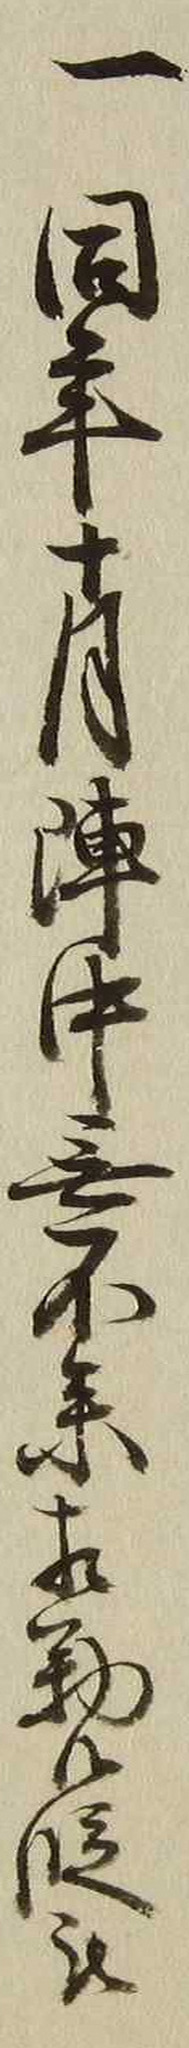一同年十月陣中無不参相勤候段被
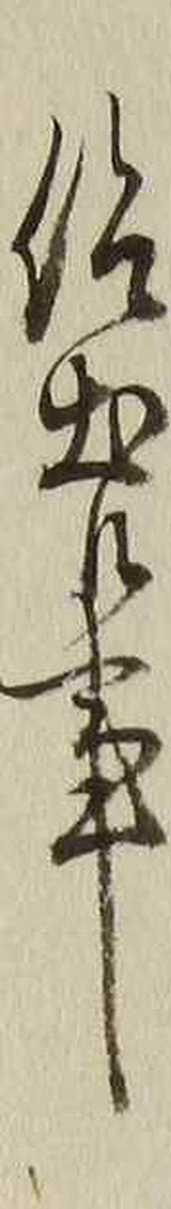仰出候事
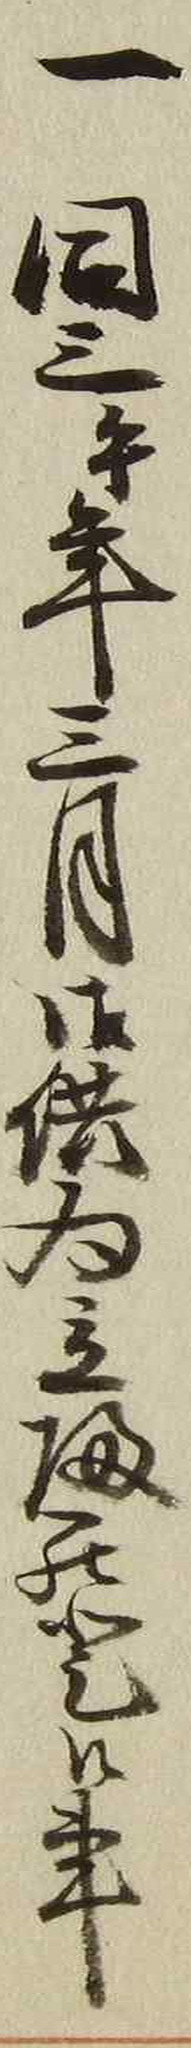一同三午年三月御供為立帰罷登候事
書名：諸士系譜　巻之53　に之部4
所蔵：会津若松市立会津図書館
